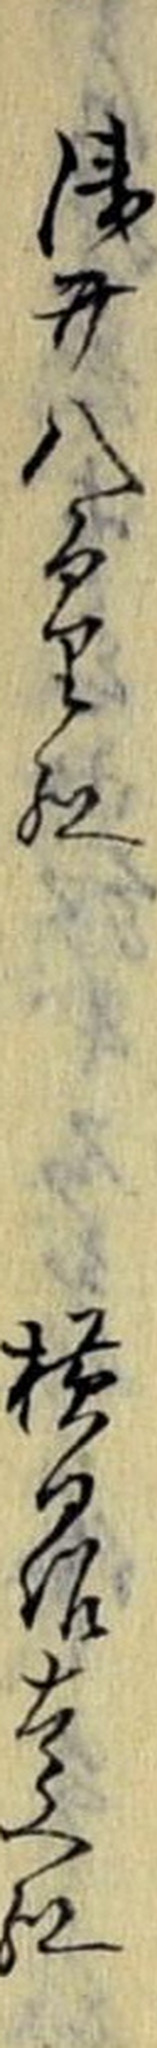浅井八百里組横田作太夫組
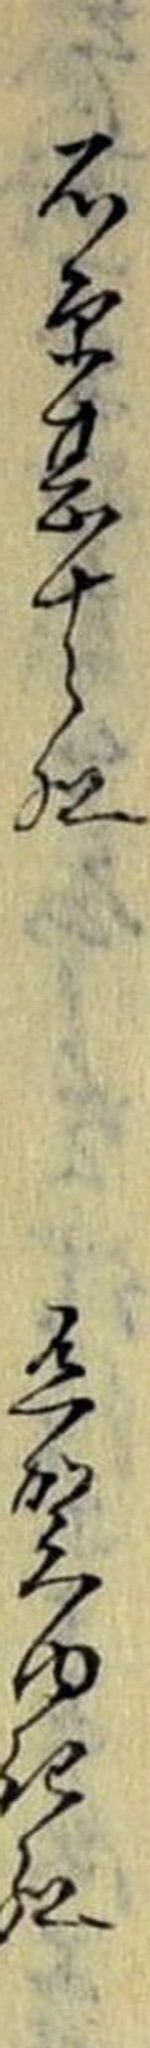石原甚十老組有賀内記組
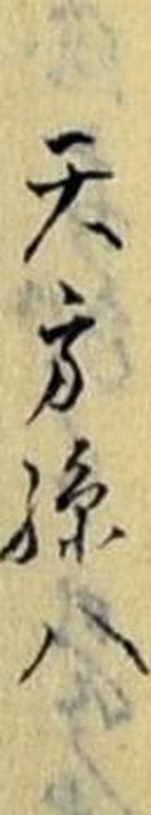天方孫八
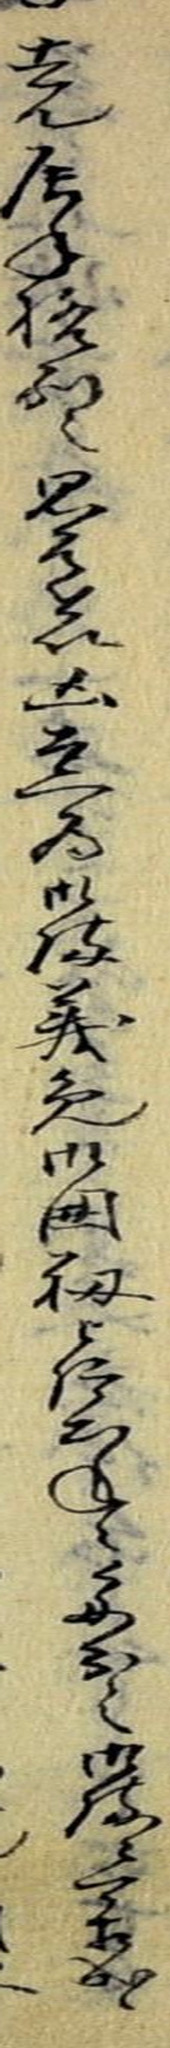○去ル辰年格別之思召を以凶荒為御備義免御囲籾被仰出年々多分之御備に可相成候
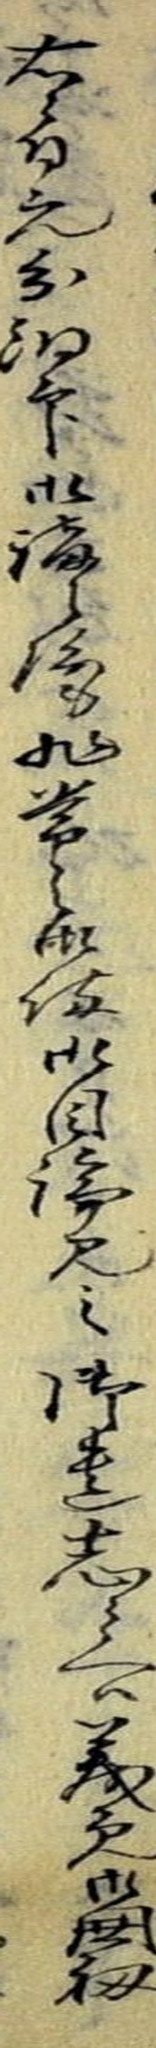右に付元分銅印御講之儀も非常之御備御目論見之御遺志に候へは義免御囲籾
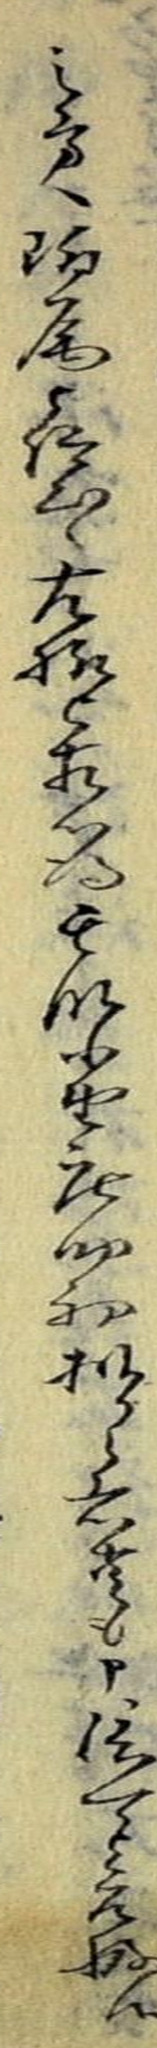之方へ附属被仰出候左様被相心得其段小野庄助掛り之者共へも申渡可被取扱候
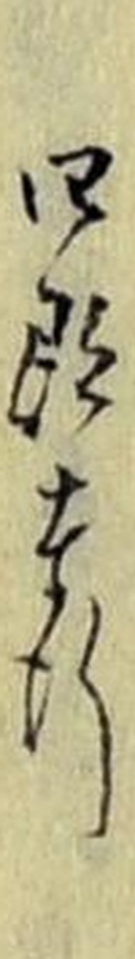四郡奉行
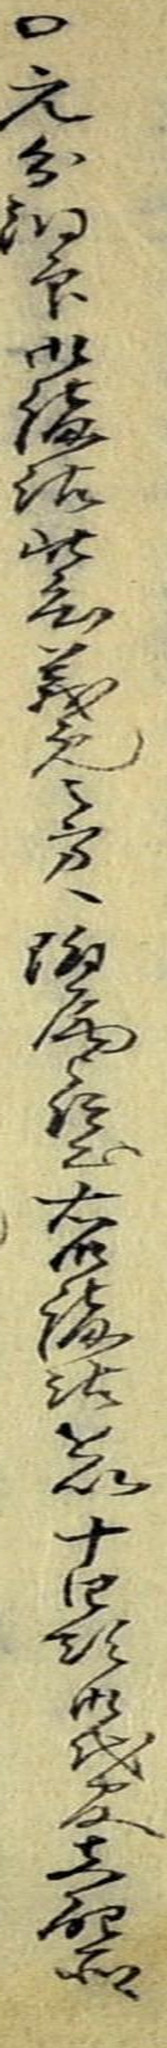○元分銅印御講銀此度義免之方へ附属被仰出右御講銀を以十四領御代官支配所へ
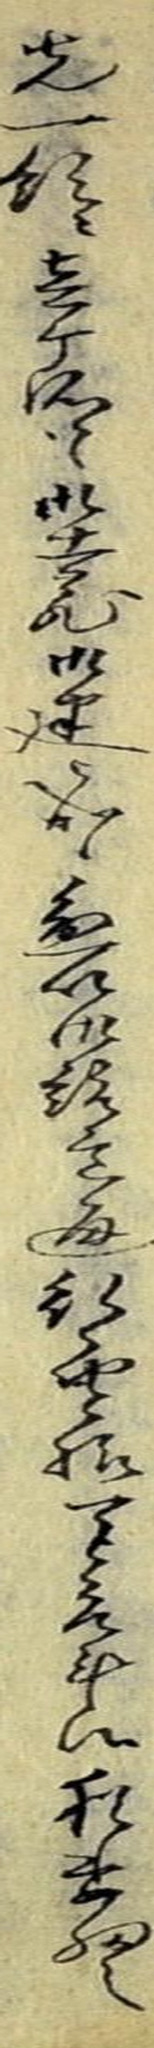先一領に壱ヶ所つヽ御土蔵御建被成候愈以御趣意通行届候様可被取斗候猶委細之
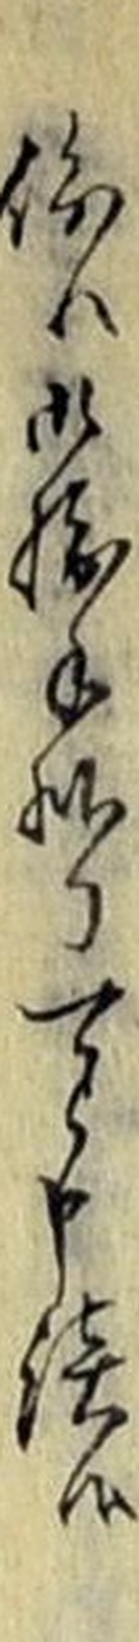儀は御勝手掛り可被申談候
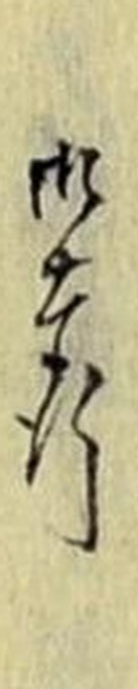御奉行
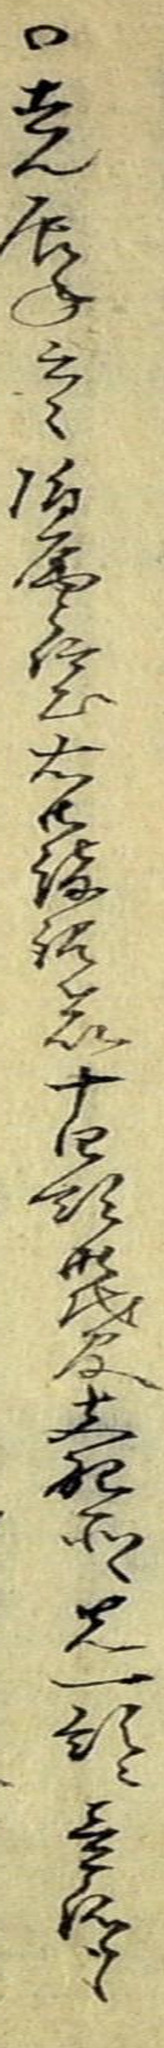○去ル辰年云々附属被仰出右御講銀を以十四領御代官支配所へ先一領に一ケ所つヽ
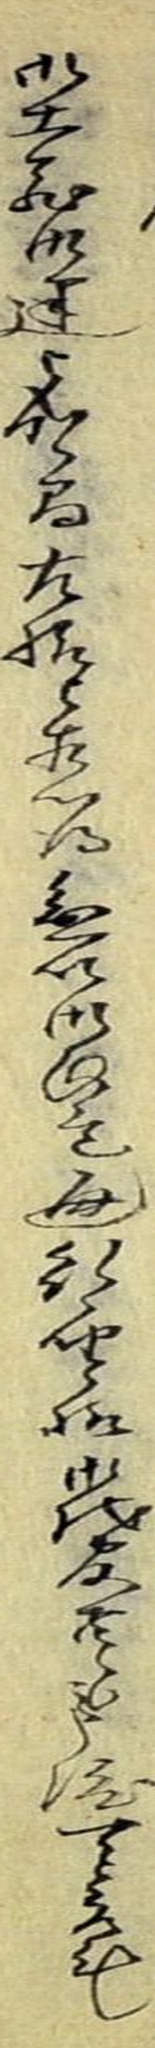御土蔵御建被成候間左様被相心得愈以御趣意通行届候様御代官共へも申渡可被取斗候
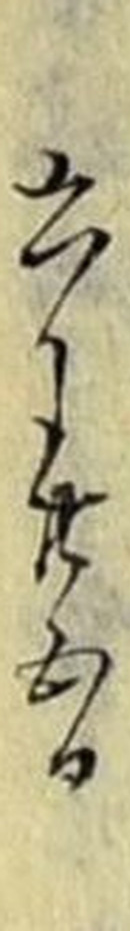六月廿五日
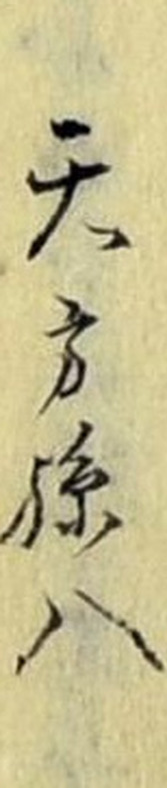天方孫八
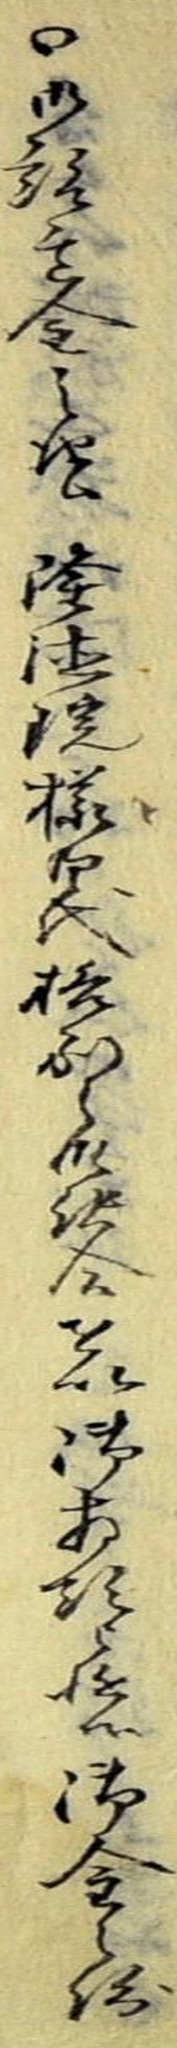○御趣意金之儀は隆徳院様御代格別之御訳合を以御拝領被遊候御金之儀
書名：命令之部 六
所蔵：福井県文書館 Fukui Prefectural Archives
